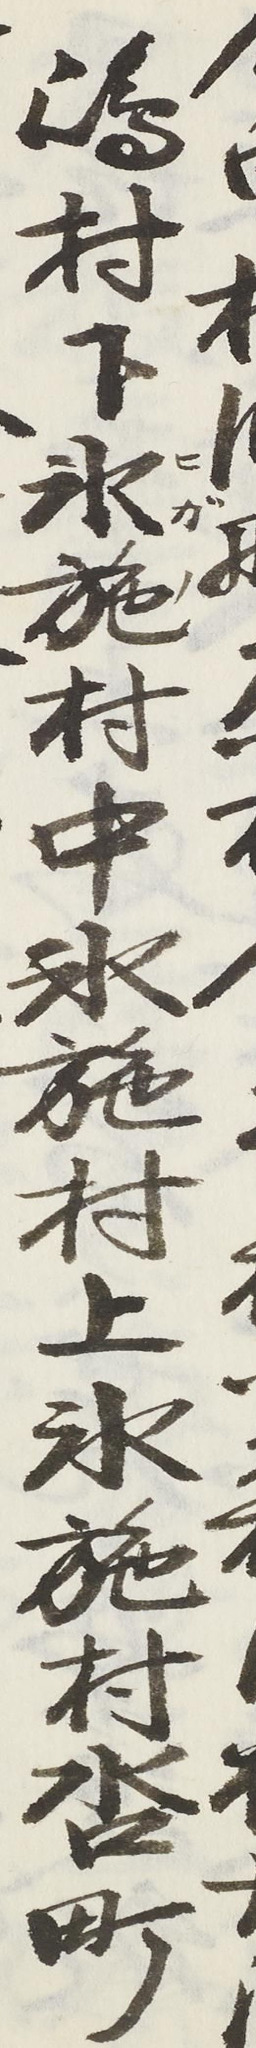嶋村下氷施村中氷鉋村上氷鉋村沓町
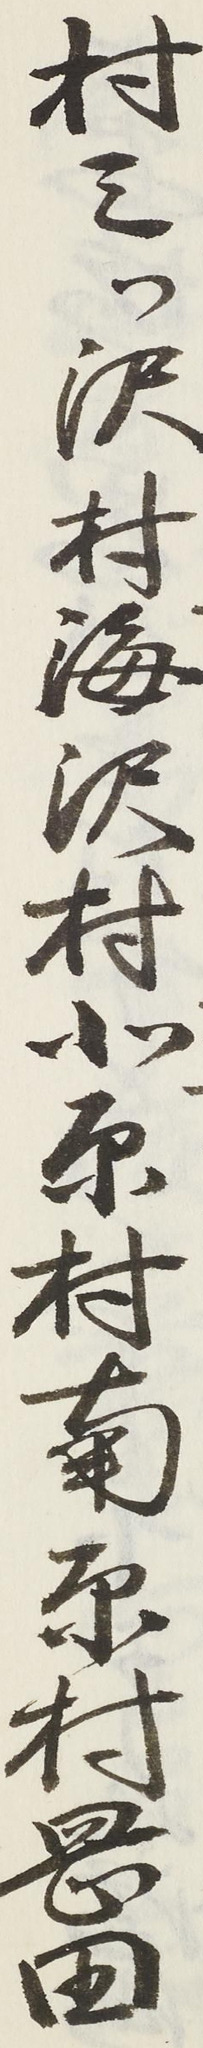村三ッ沢村海沢村北原村南原村岡田
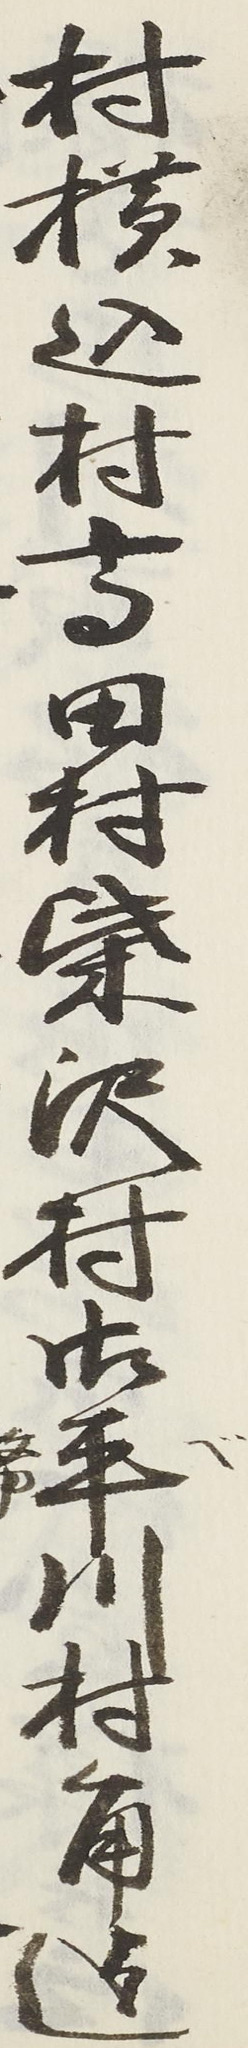村横込村高田村柴沢村御平村角迄
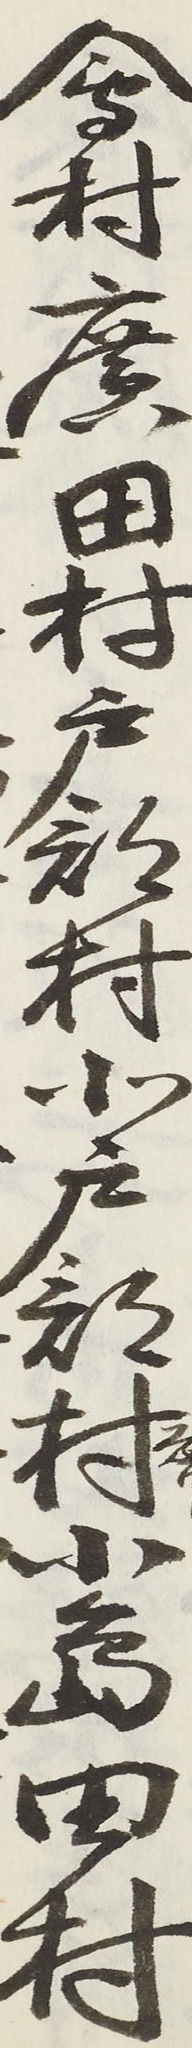会村広田村戸部村北戸部村小嶋田村
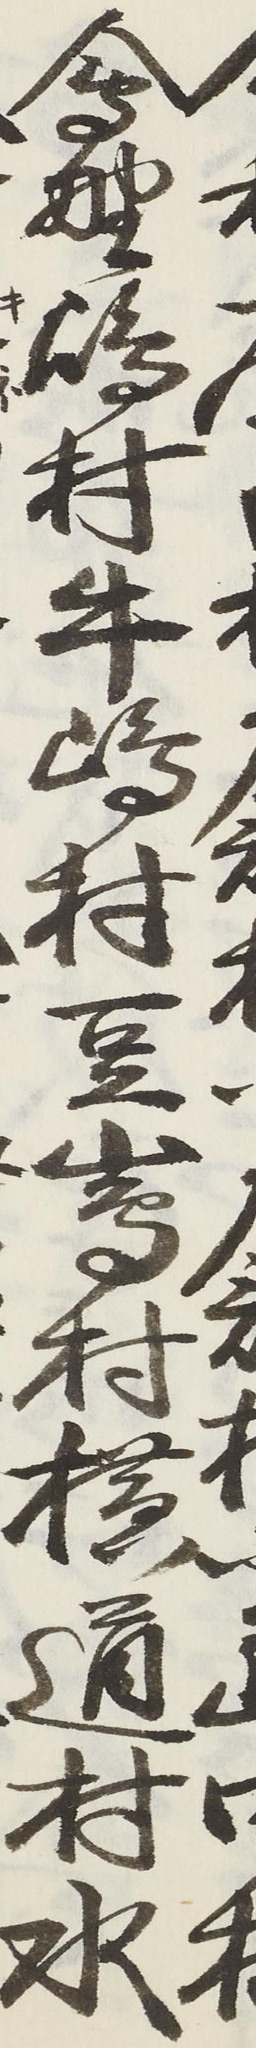会野嶋村牛嶋村豆嶋村横通村水
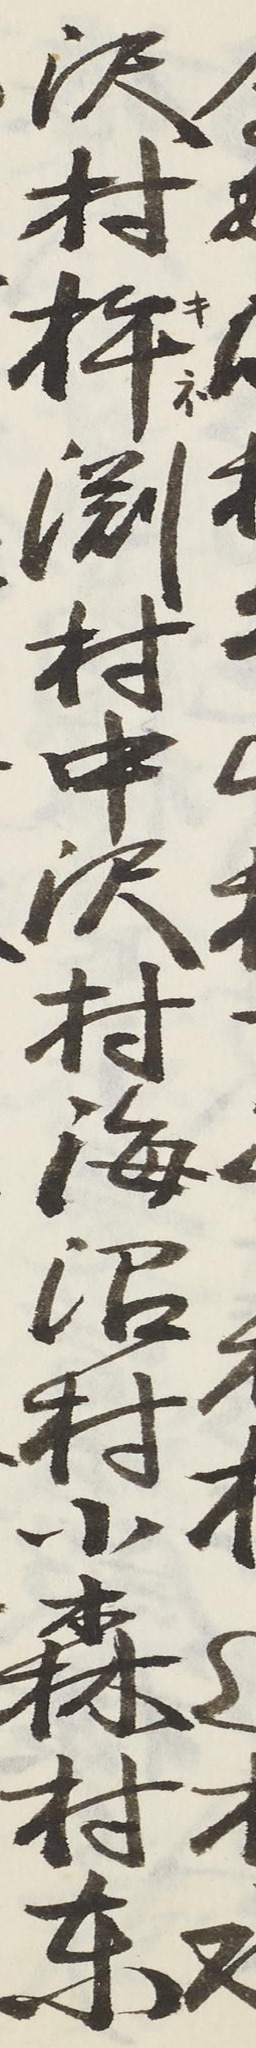沢村杵淵村中沢村海沼村小森村東
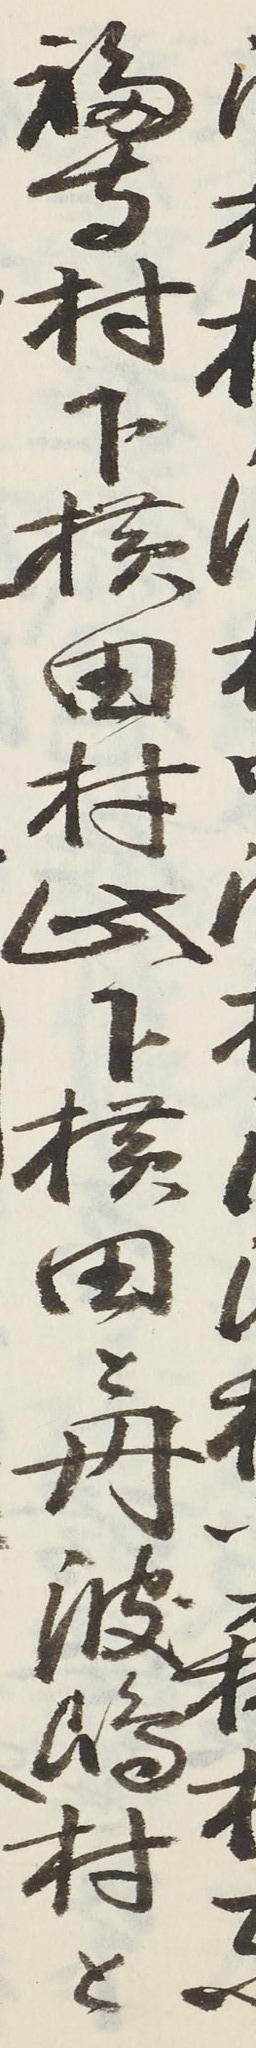福寺村下横田村此ㇳ横田と丹波嶋村と
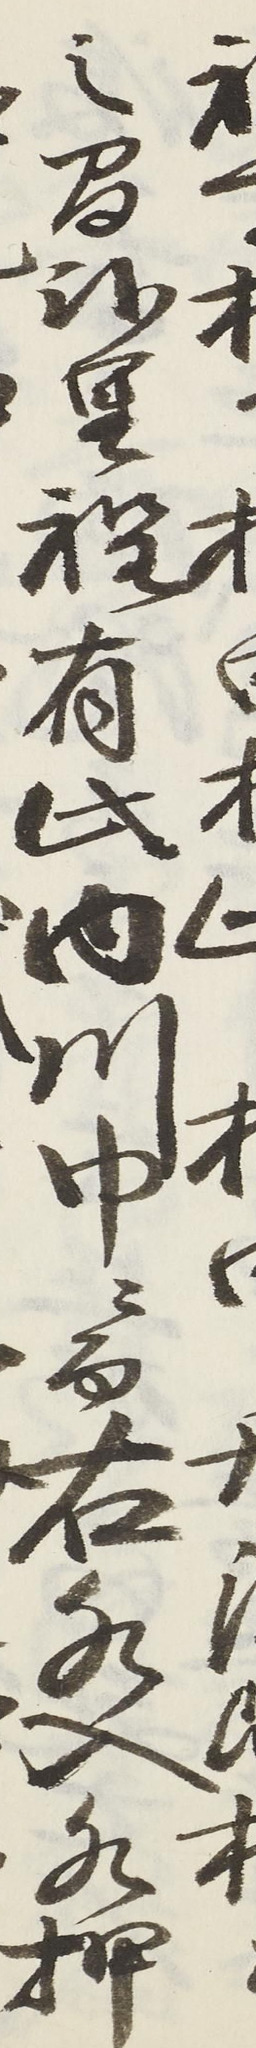之間弐里程有此内川中二而右水入水押
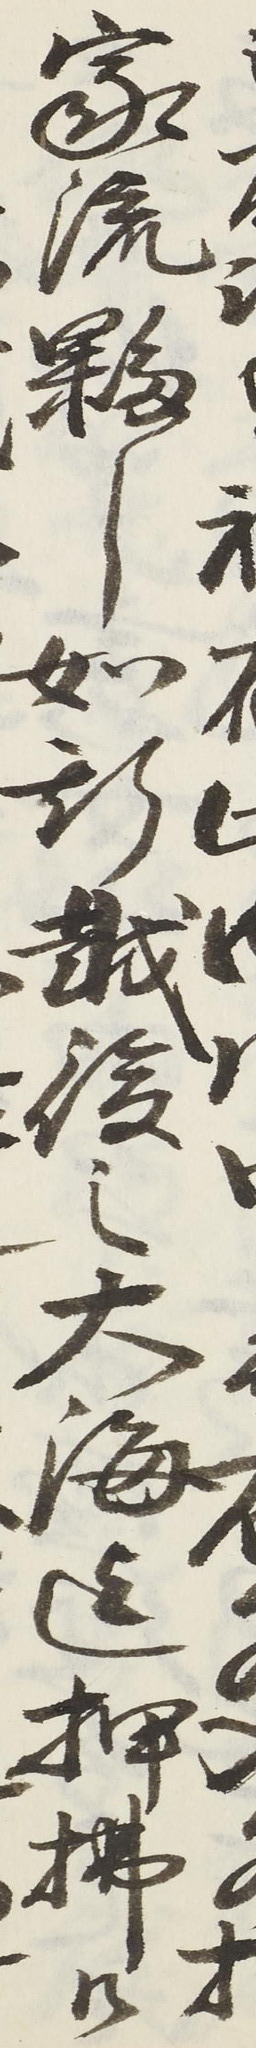家流夥し如斯越後之大海迄押払け
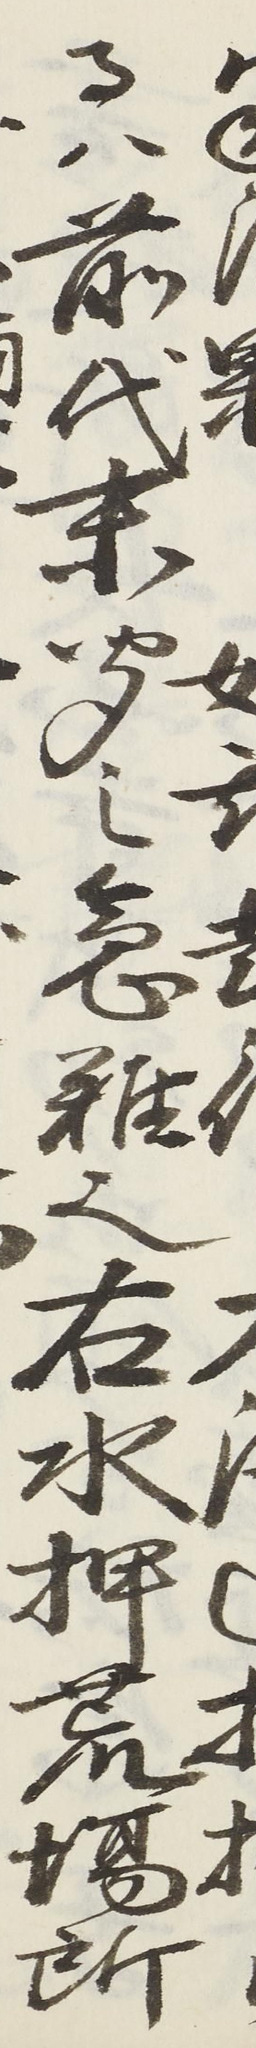るハ前代未聞之急難也右水押荒場所
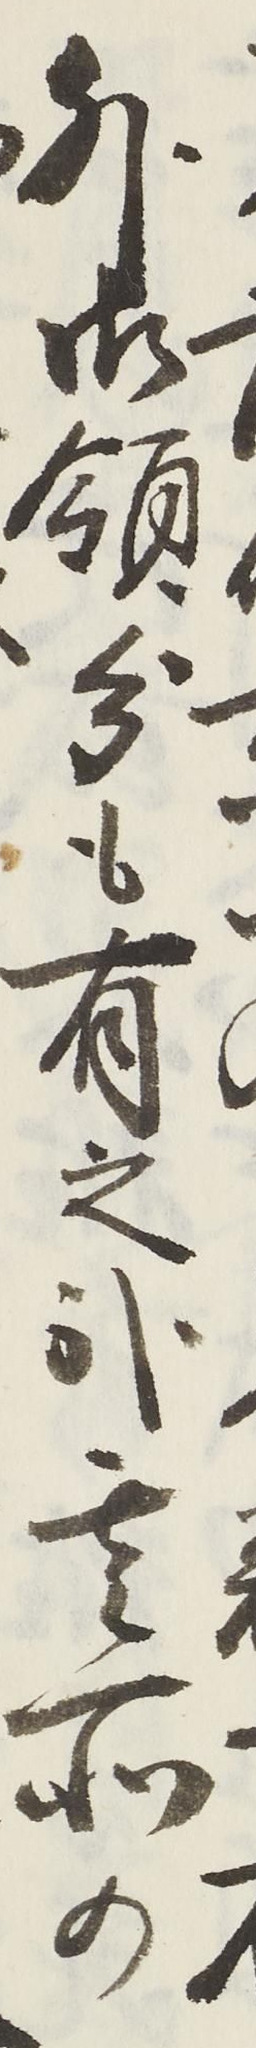外御領分も有之哉其所の
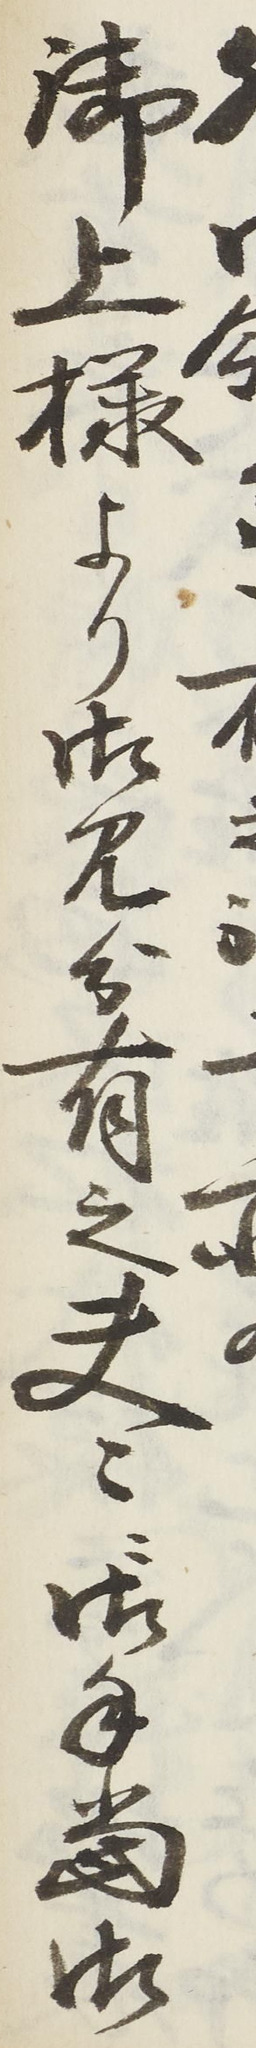御上様より御見分有之夫々二御手当御

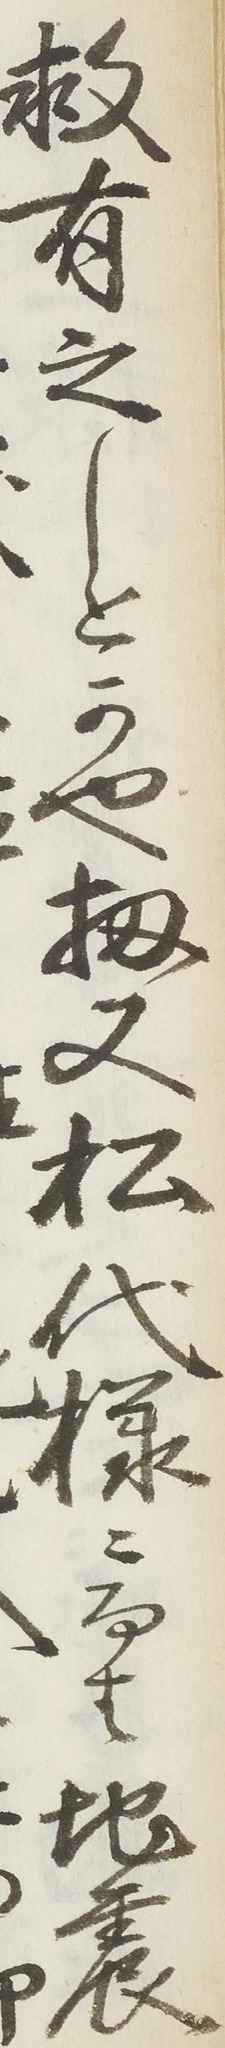救有之しとかや扨又松代様二而ハ地震
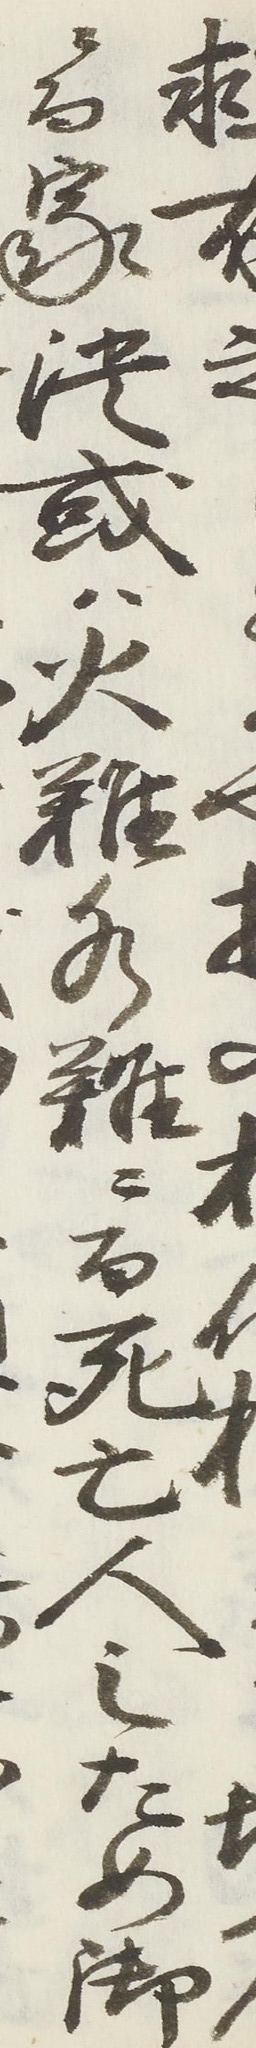二而家潰或ハ火難水難二而死亡人之ため御
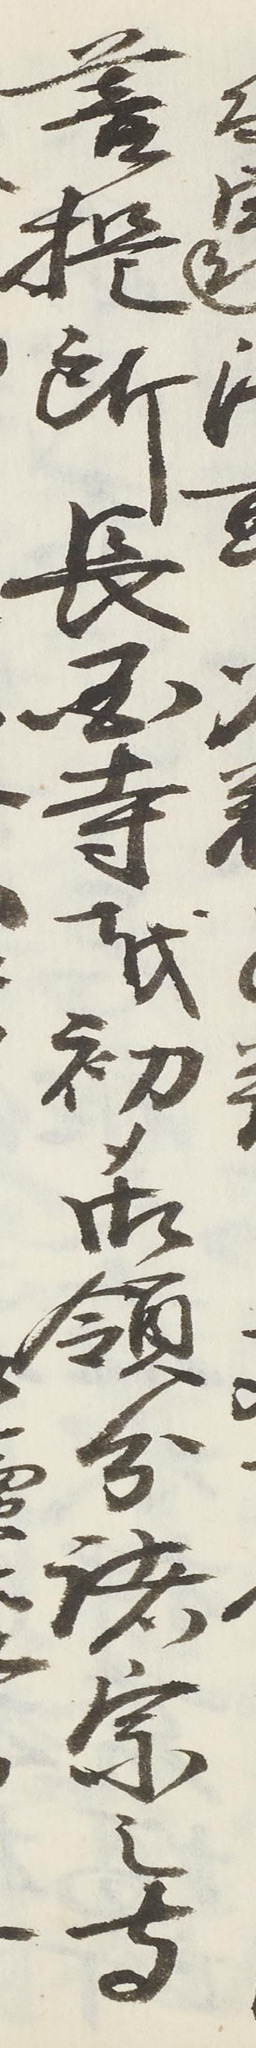菩提所長国寺を初メ御領分諸宗之寺
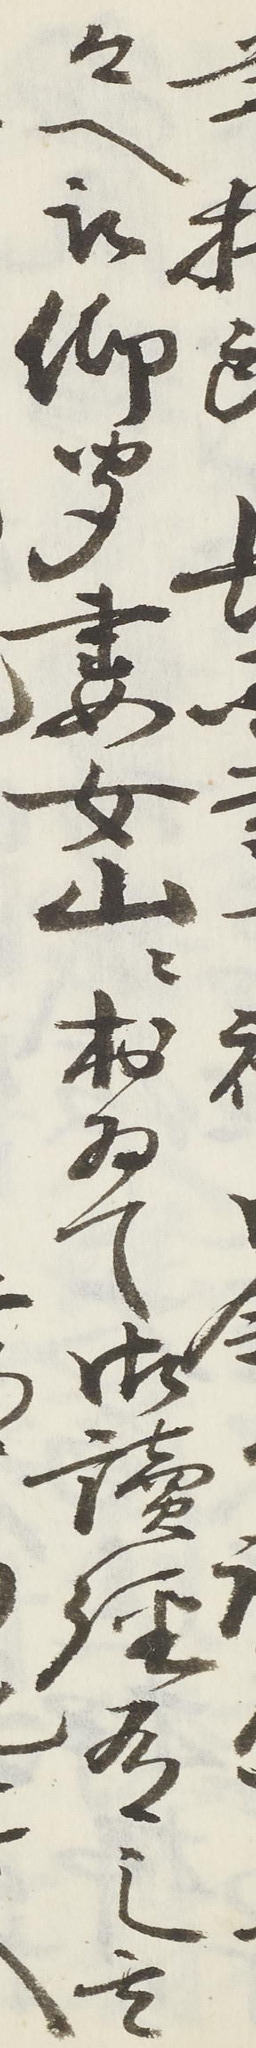々へ被仰聞妻女山におゐて御読経有之其
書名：弘化四年地震記
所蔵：東京大学地震研究所図書室 Earthquake Research Institute Library, The University of Tokyo, JAPAN
